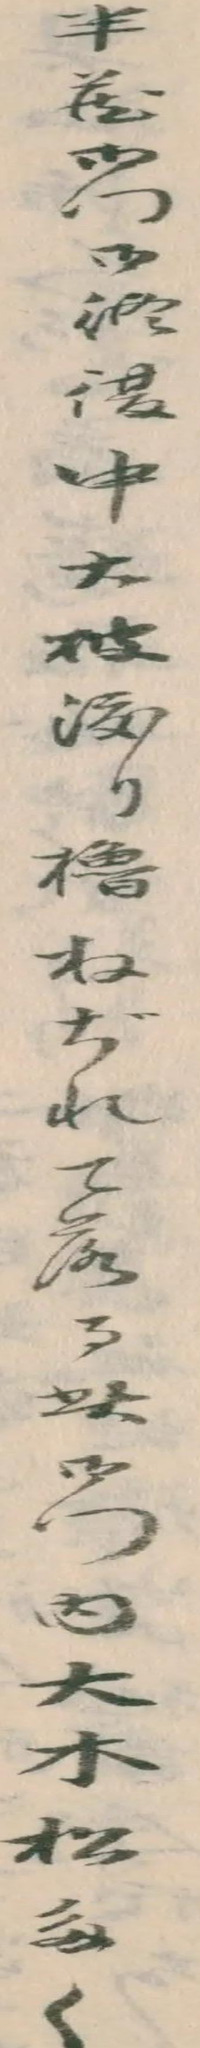半蔵御門御修復中大破渡り櫓ねぢれて落る此御門内大木松多く
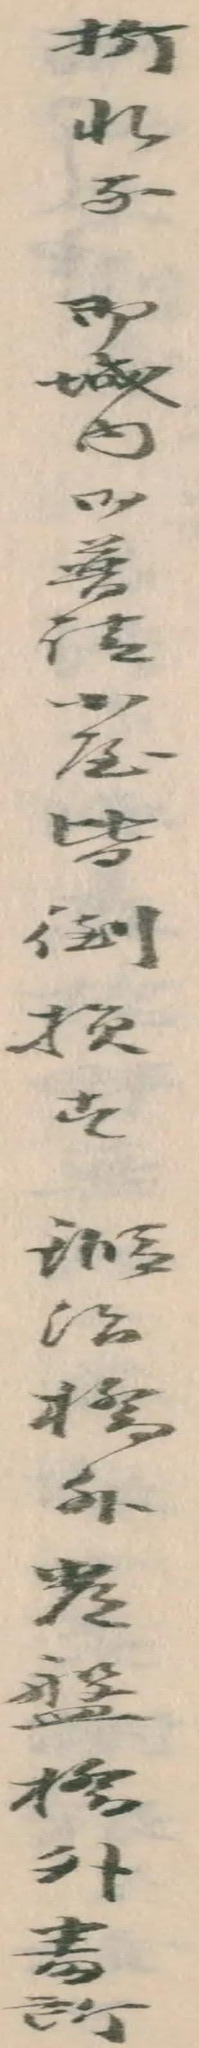折れる御城内御普請小屋皆倒損す鍛冶橋外常盤橋外番所
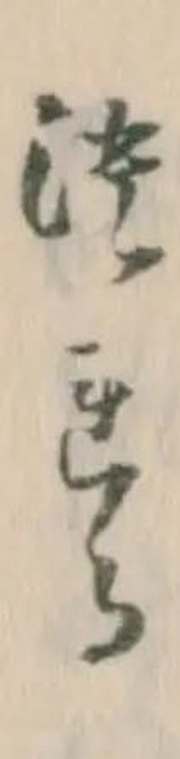潰れる
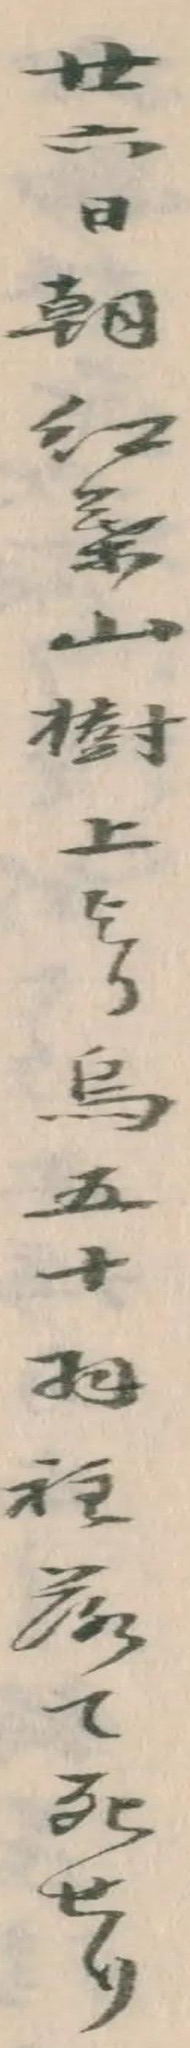廿六日朝紅葉山樹上より烏五十羽程落て死せり
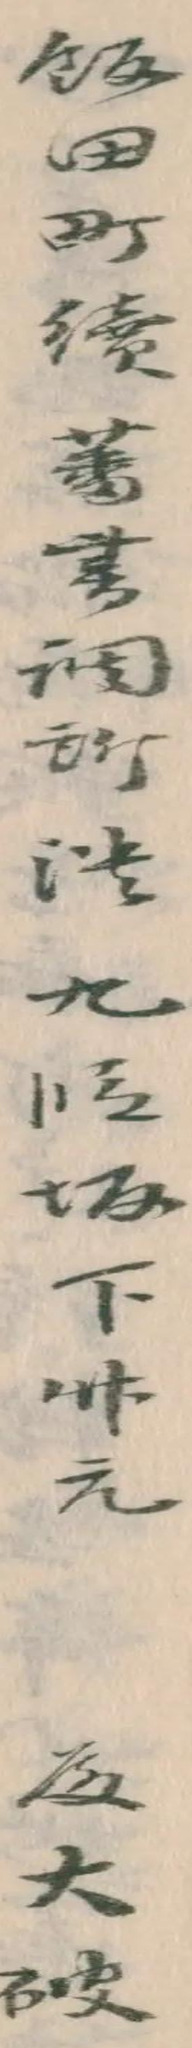飯田町続蕃書調所潰九段坂下竹元殿大破
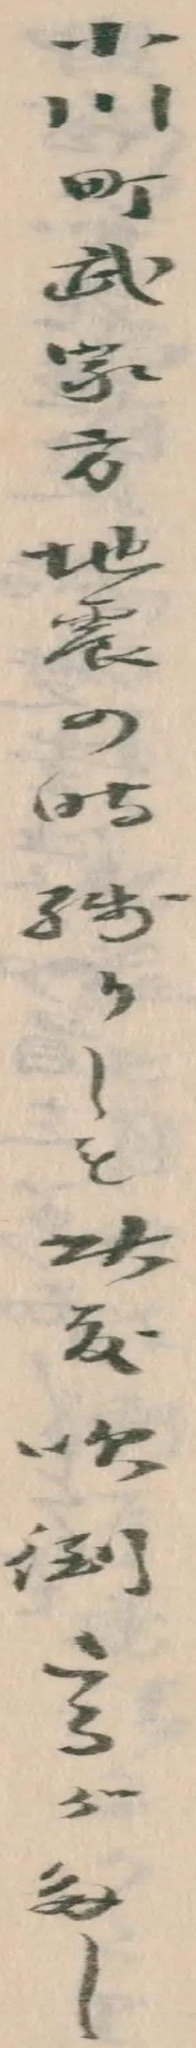小川町武家方地震の時残りしも此度吹倒たる分多し
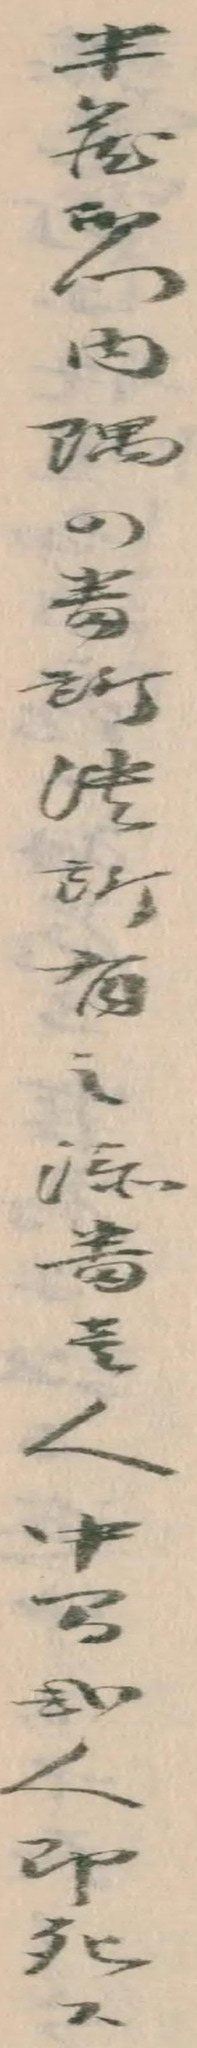半蔵御門内隅の番所潰所有之添番壱人中間弐人即死ス
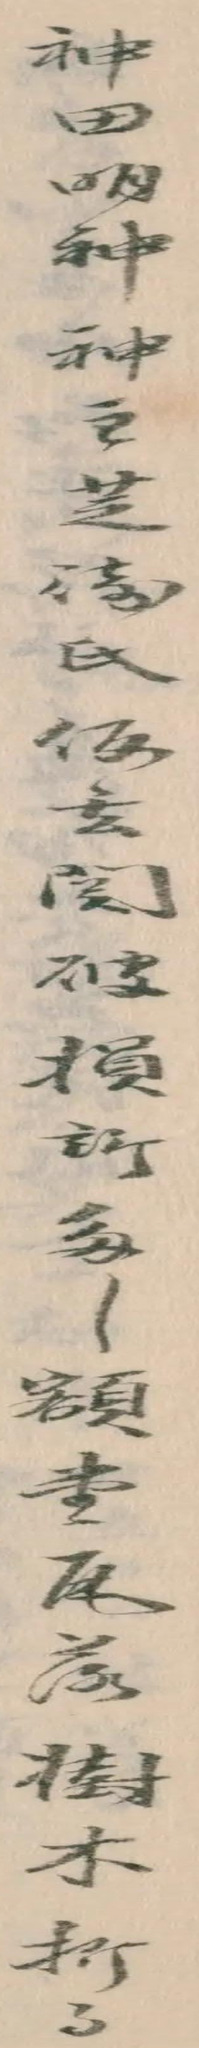神田明神神主芝崎氏仮玄関破損所多し額堂瓦落樹木折る
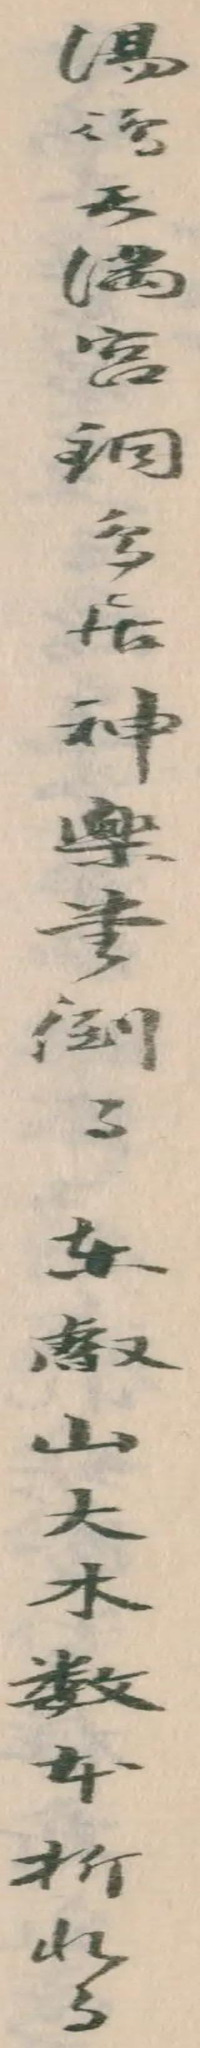湯嶋天満宮銅鳥居神楽堂倒る東叡山大木数本折れる
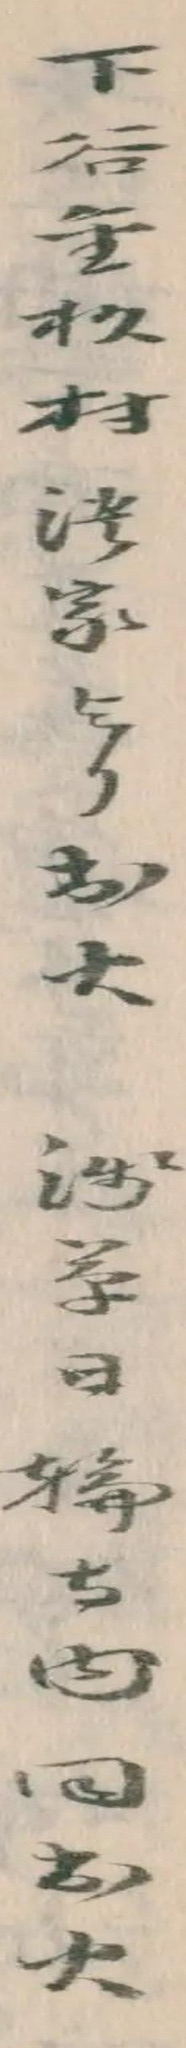下谷金杉村潰家より出火浅草日輪寺内同出火
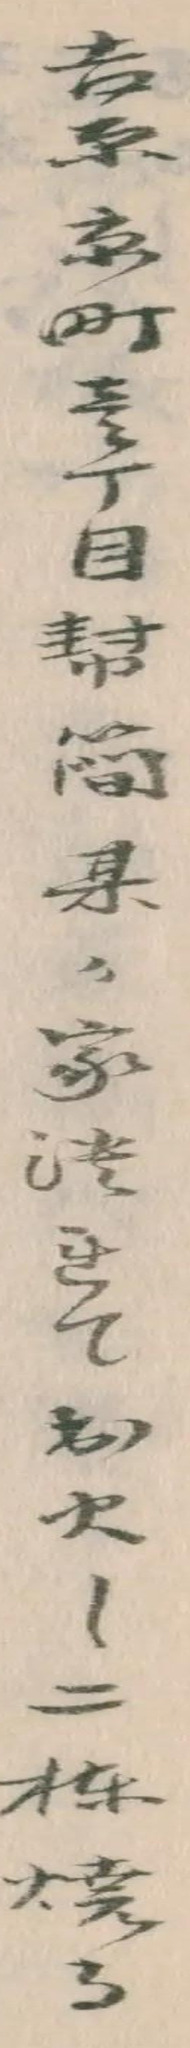吉原京町壱丁目幇簡某か家潰れて出火し二棟焼る
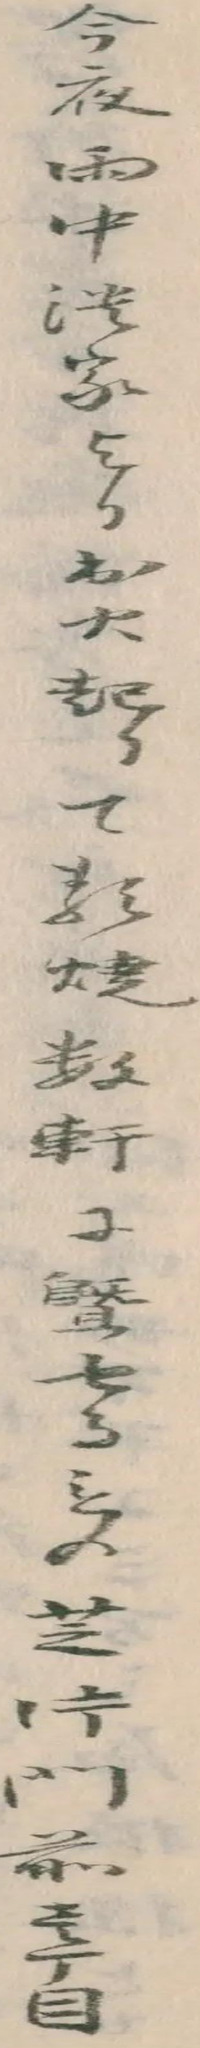今夜雨中潰家より出火起りて類焼数件に曁せるもの芝片門前壱丁目
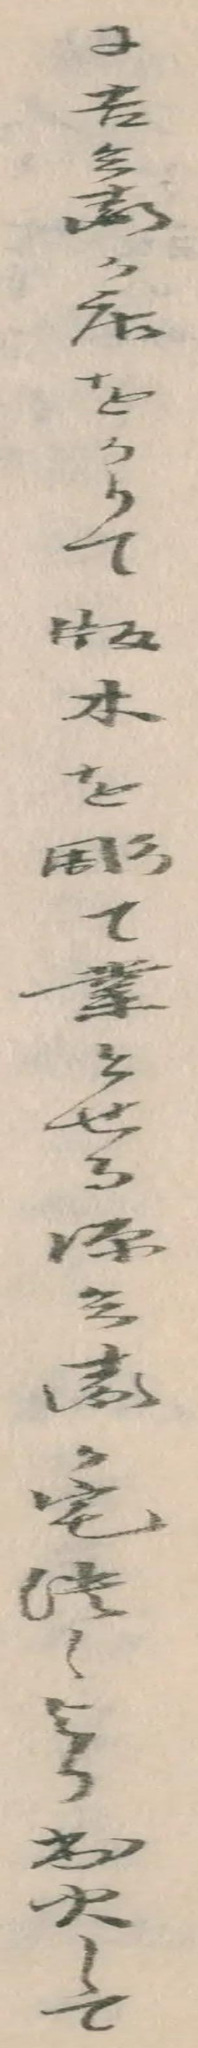に吉兵衛か店をかりて版木を彫て業とせる源兵衛か宅潰しより出火して
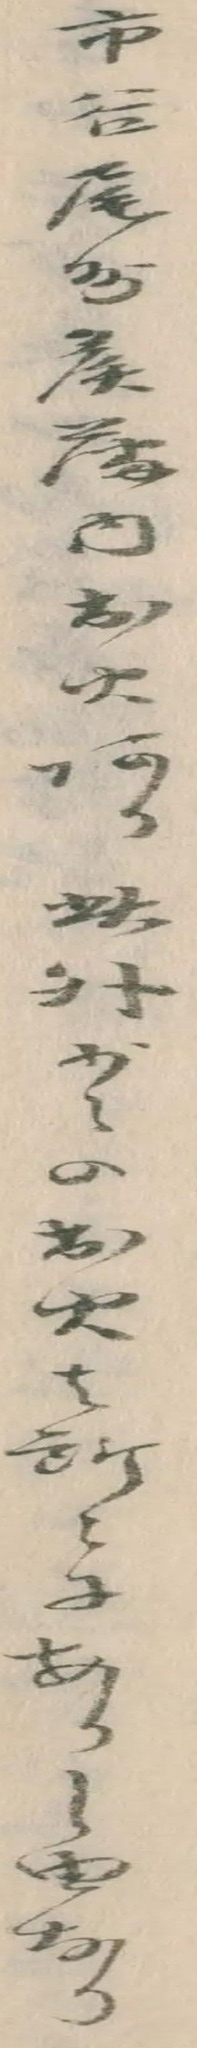市谷尾州侯藩内出火あり此外少しの出火は所々にありし由なり

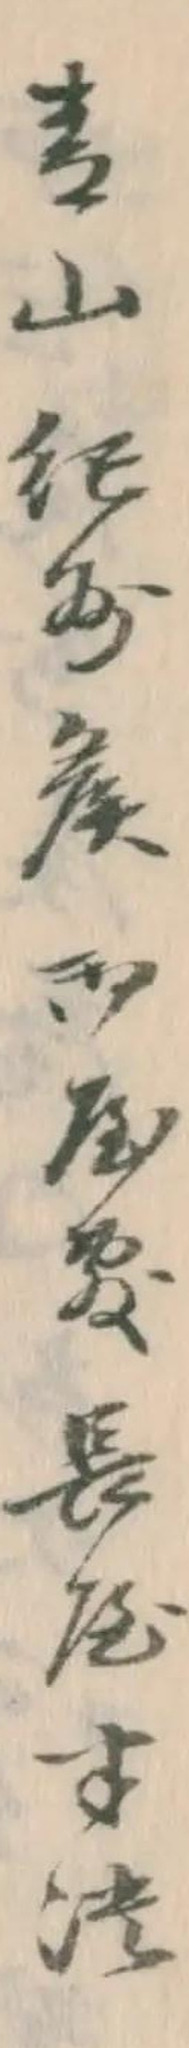青山紀州侯御屋敷長屋半潰
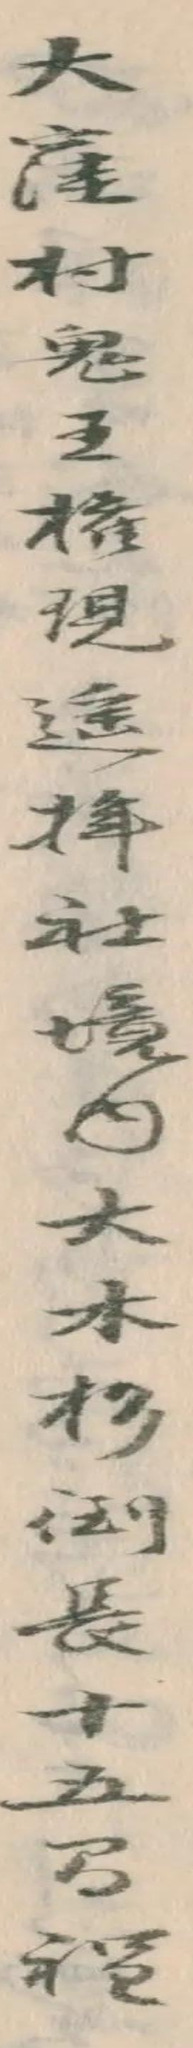大窪村鬼王権現遥拝社境内大木杉倒長十五間程
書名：地災撮要. 巻10(地震之部) 上,下
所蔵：国立国会図書館 National Diet Library, JAPAN
